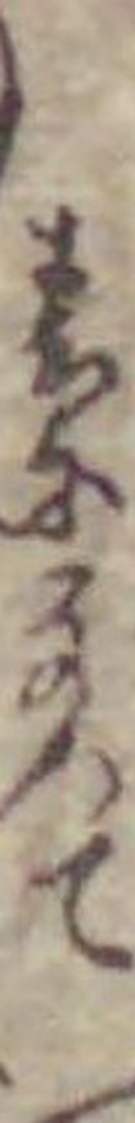春になつて
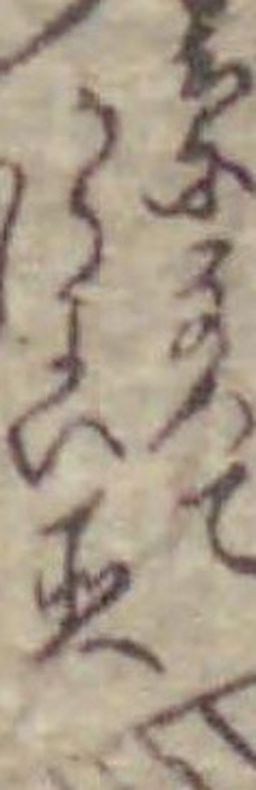からよい所へ
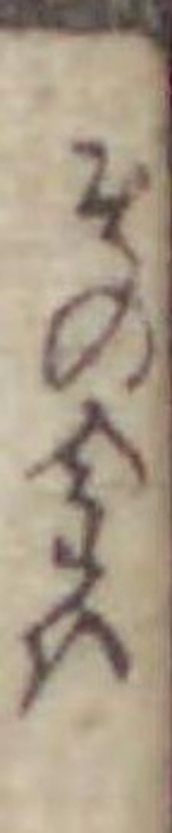その金は
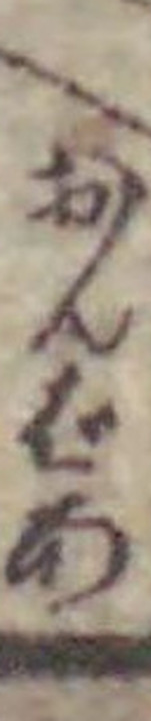おんばあ
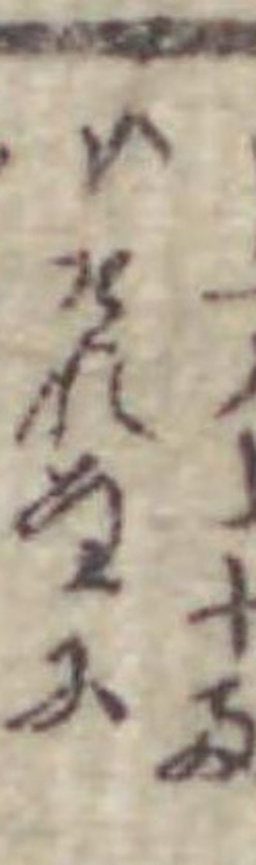はそれ様に
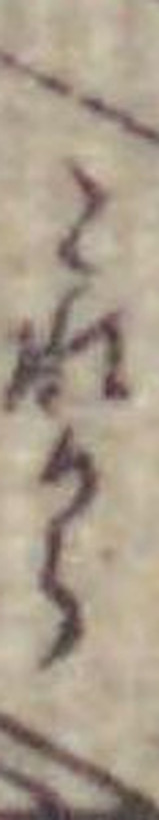これから
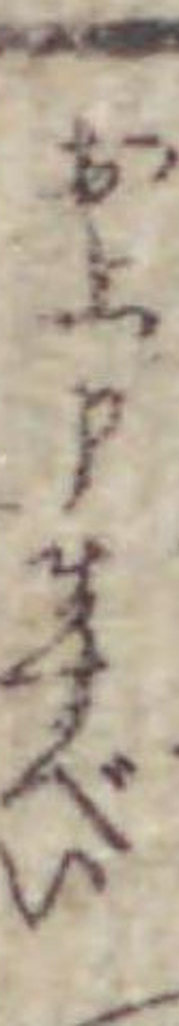お上申ますべい
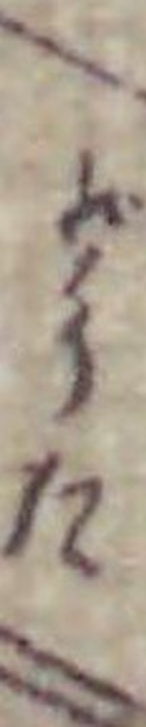どうに
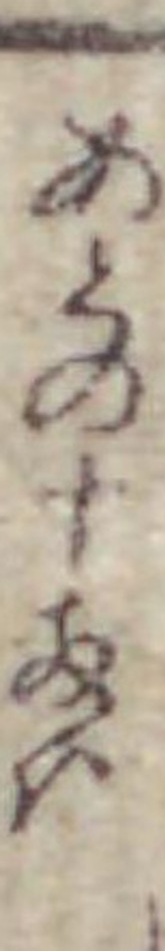あとの十両は
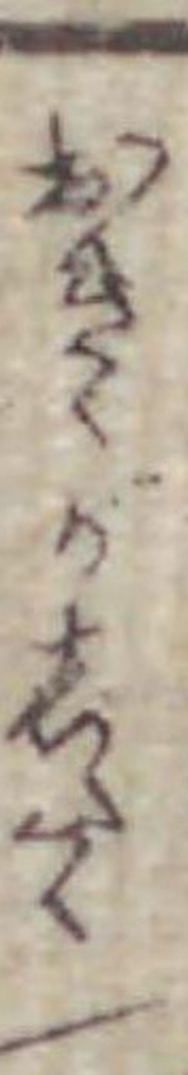おきくがしたく
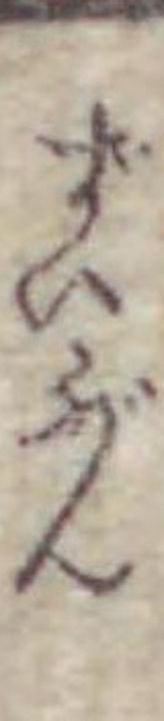ずいぶん
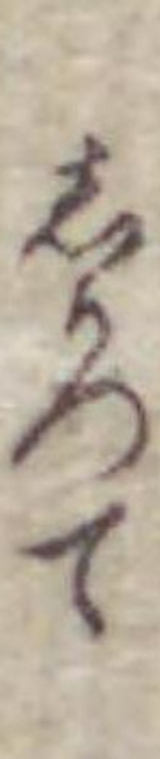しかつて
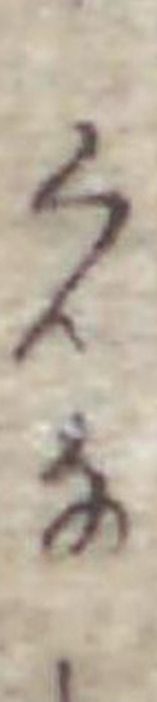くんな
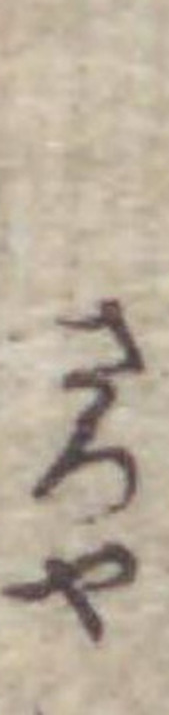されや
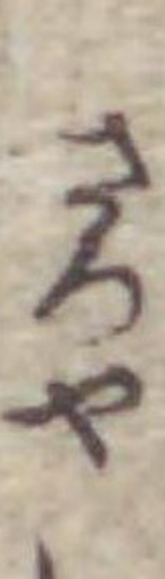されや

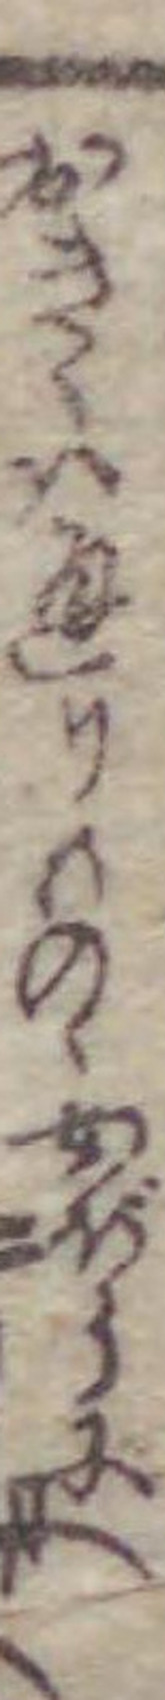おきくは通りものゝ女ぼうに
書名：嗚呼不侭世之助噺 : 3巻
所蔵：国立国会図書館 National Diet Library, JAPAN
